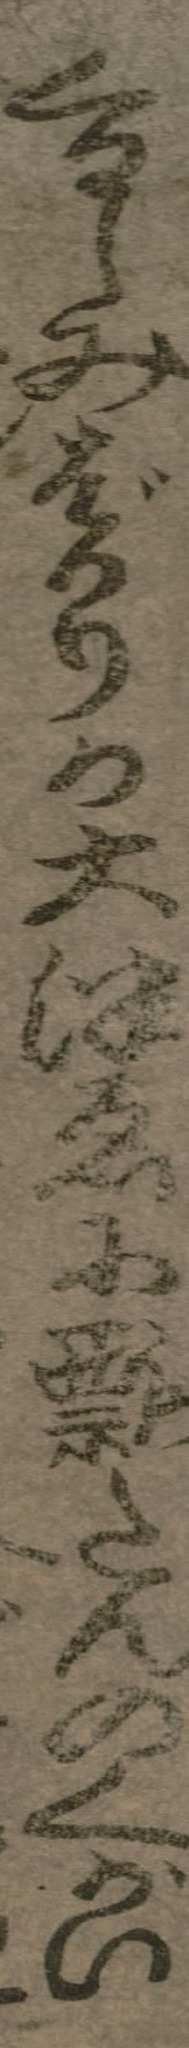くるしみばかりか大津ゑに瓢たんのくがい
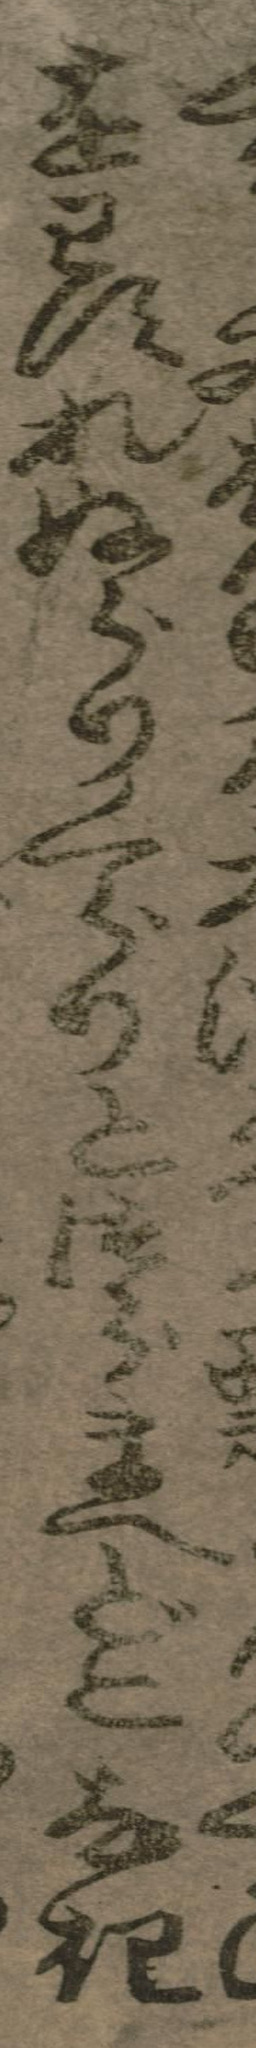をわすれぬらりくらりとつらまへどこなき
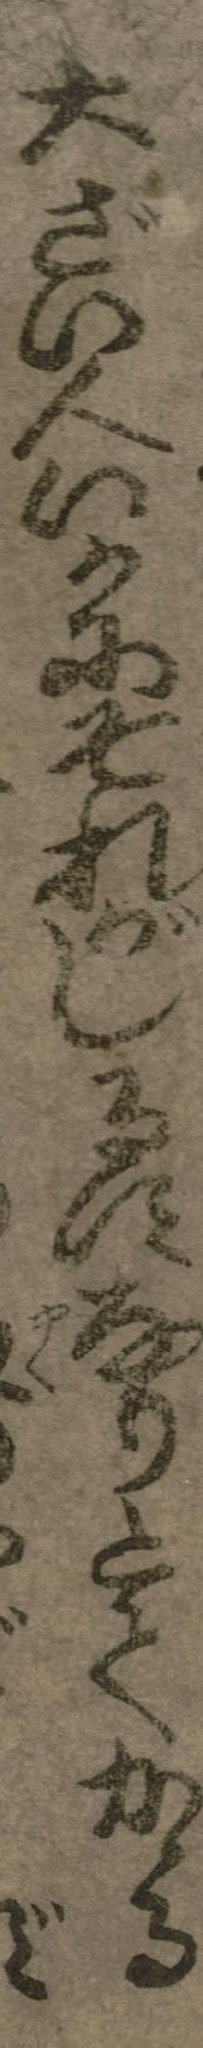大ざい人いかにそれがしるすなりとてかゝる
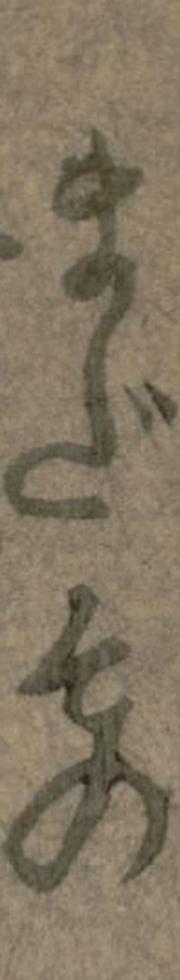まだその
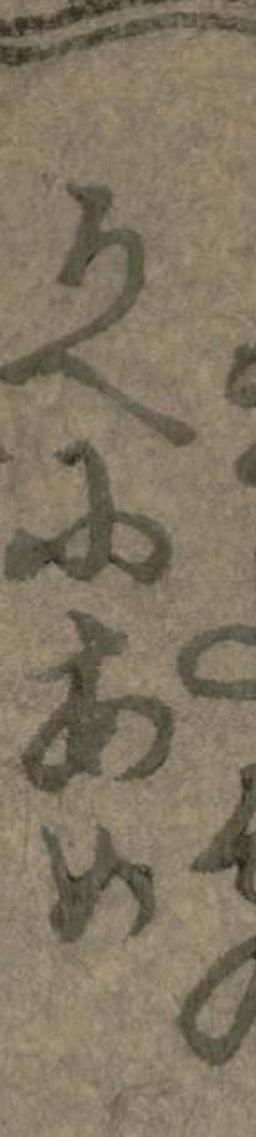うへにあめ
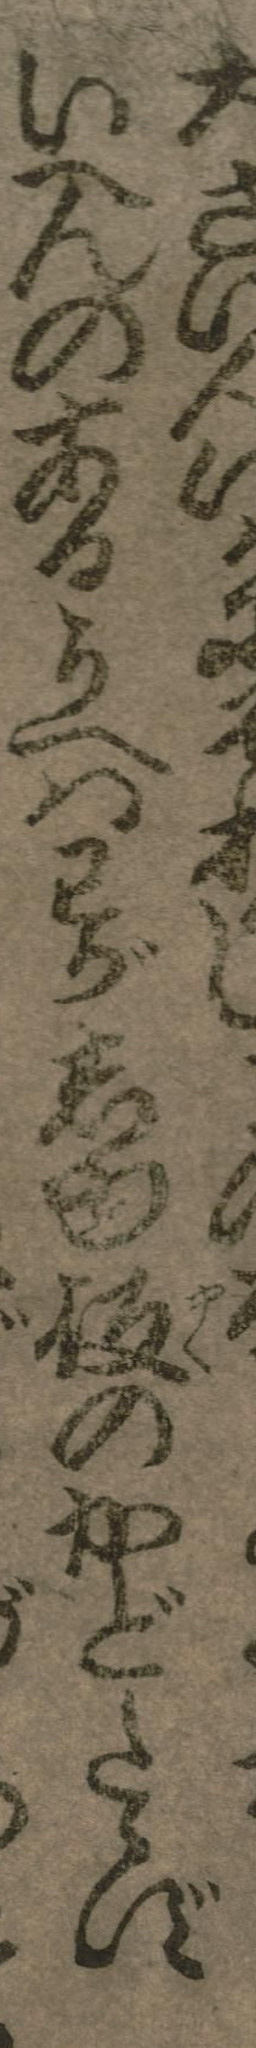いへんのあるうへはわがしゆ役のかどたゝず
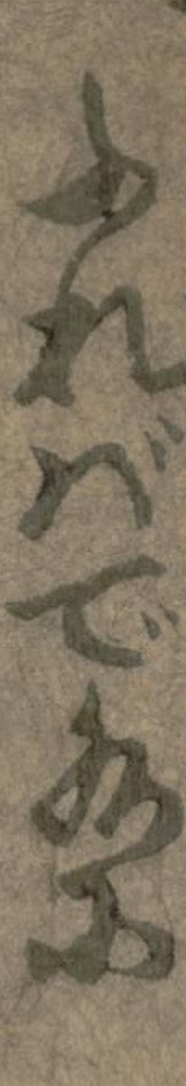ふればで水に
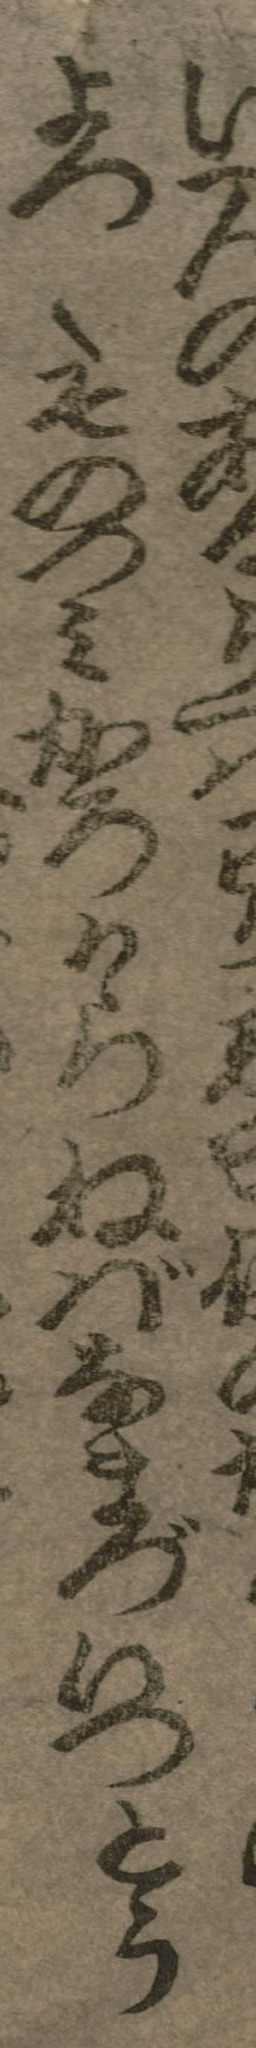よつてそのつみかろからねばなまづいつとう
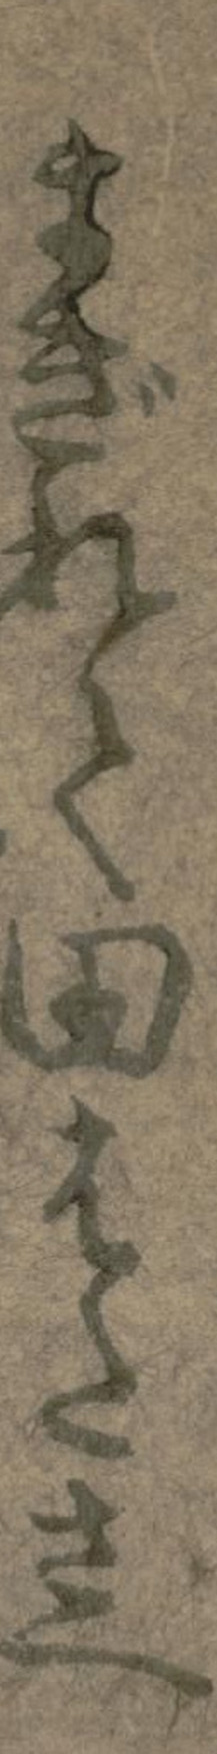まぎれて田はたさへ
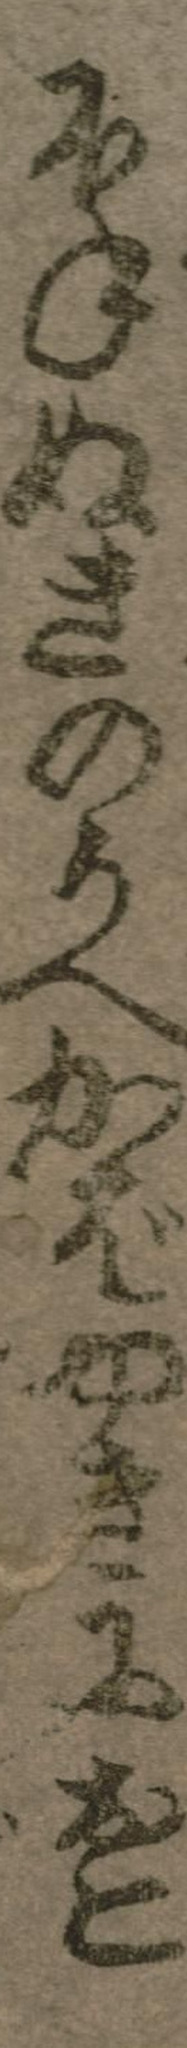ほねぬきのうへかばやきにおこ
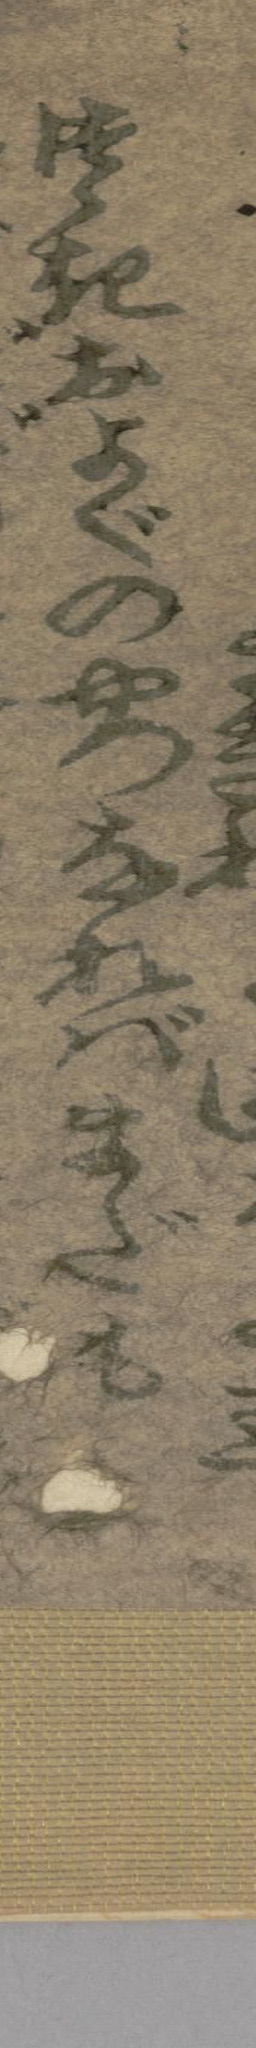つゝきおよぐのやつなればまたも
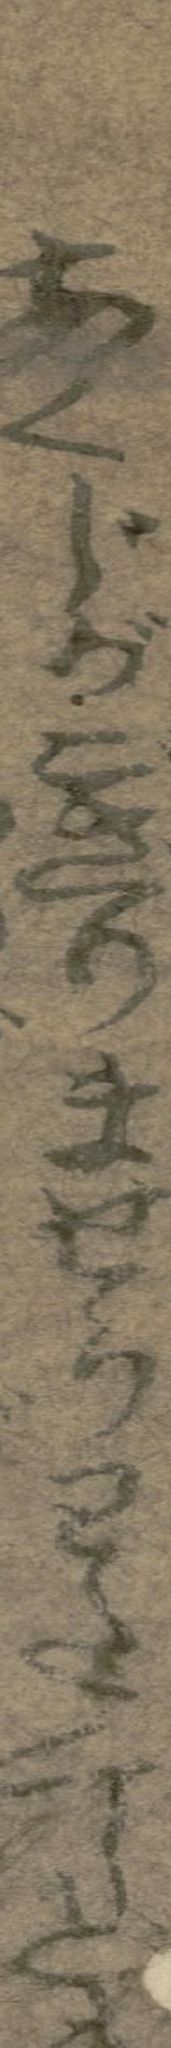あくじがござりませうわたくしども
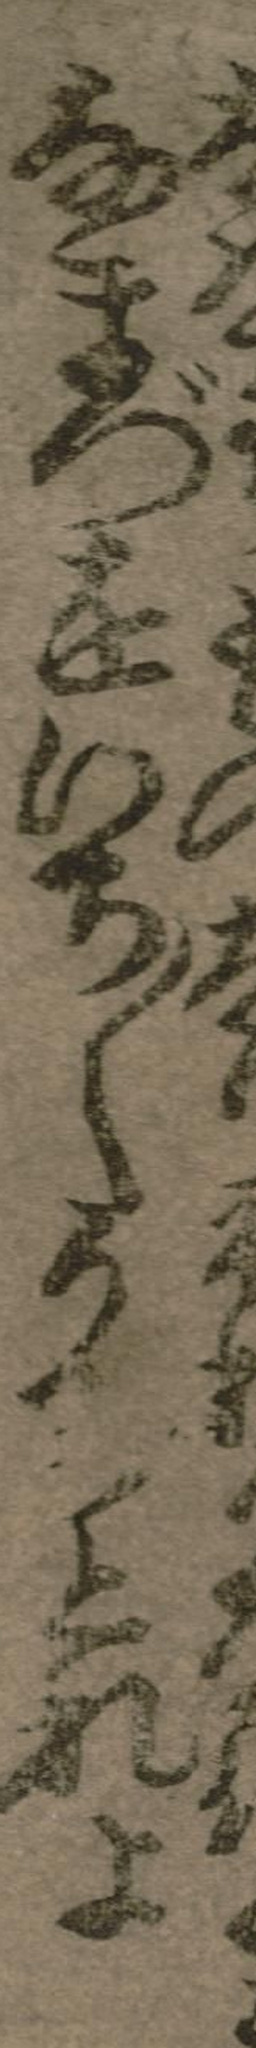なまづをいち〳〵うちとれよ
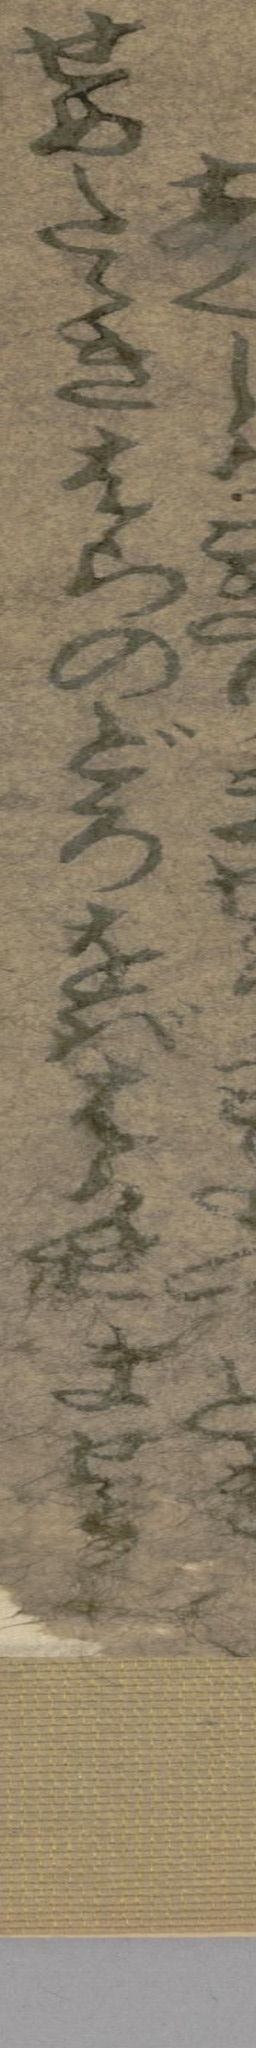せめたゝきはらのどろをばはかせませう
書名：[すい神のおしえにいのちたすかりて]
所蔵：東京大学地震研究所図書室 Earthquake Research Institute Library, The University of Tokyo, JAPAN
